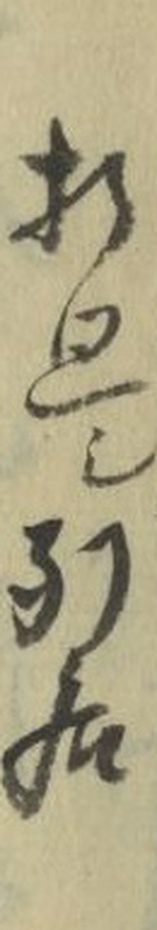折廻し列居
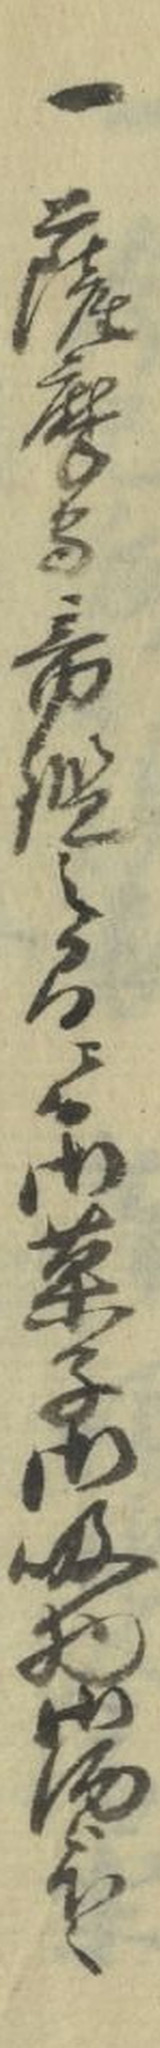一薩摩守帝鑑之間にて御菓子御吸物御酒被下之
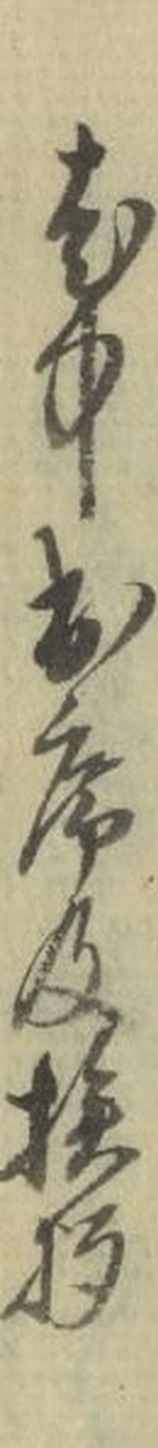老中出席及挨拶
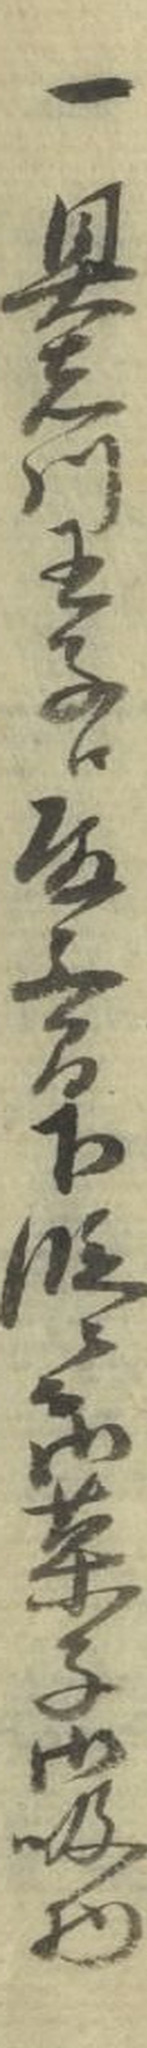一具志川王子え殿上間下段にて御菓子御吸物
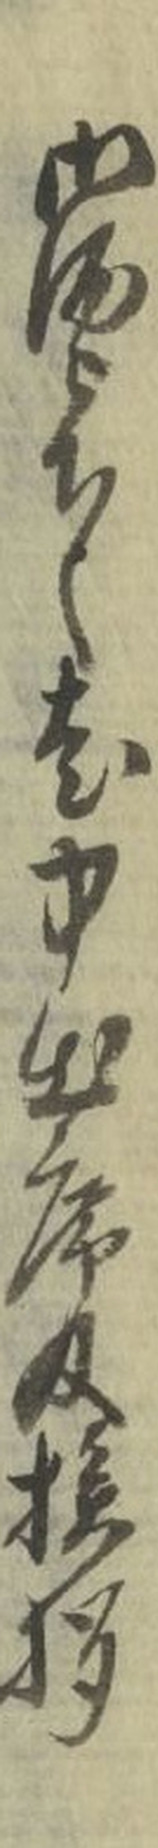御酒被下之老中出席及挨拶
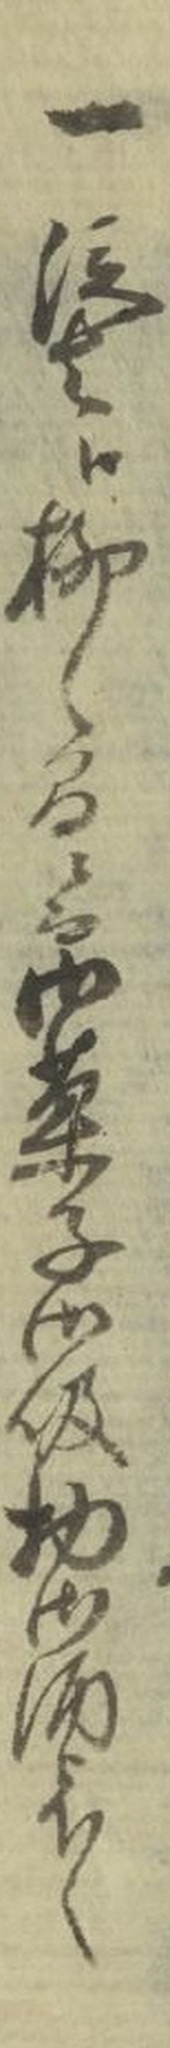一従者え柳之間にて御菓子御吸物御酒被下之
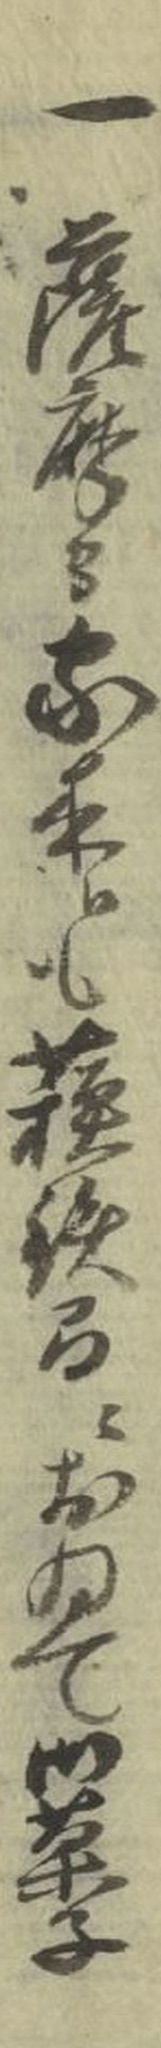一薩摩守家来えも蘇鉄間におゐて御菓子
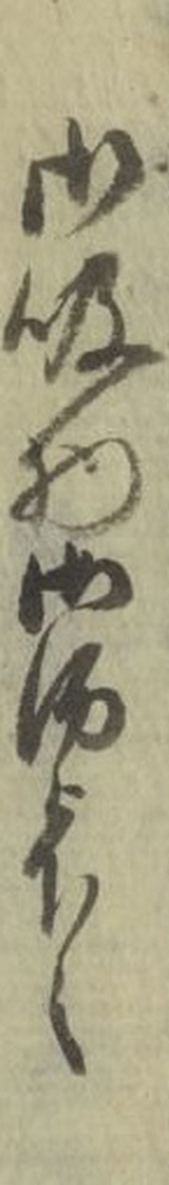御吸物御酒被下之
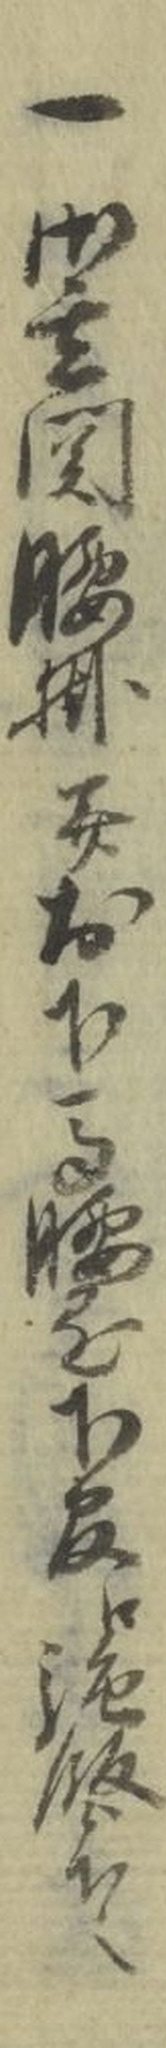一御玄関腰掛并於下馬腰懸下官え強飯被下之

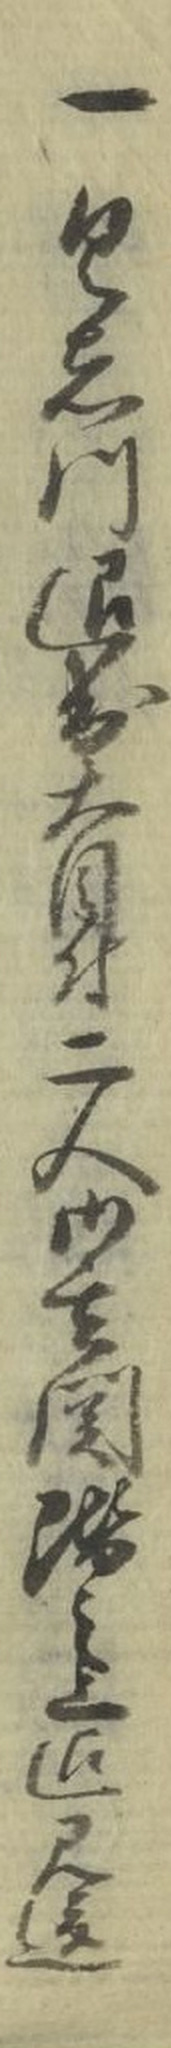一具志川退出大目付二人御玄関階之上迄見送
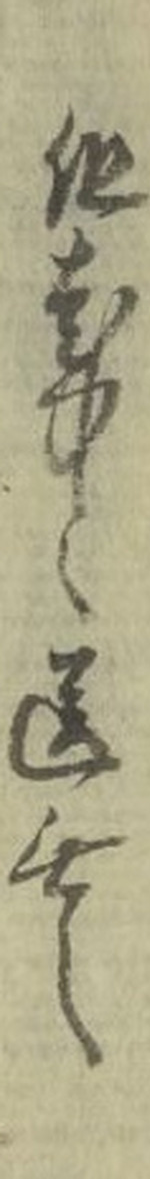但老中之送無之
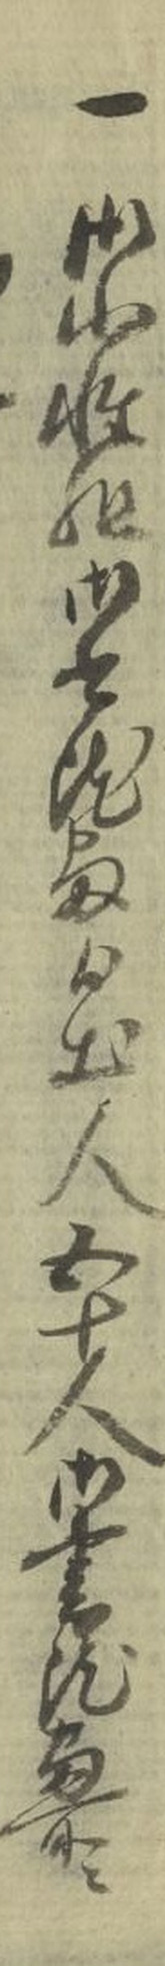一御小性組御書院番ゟ出人五十人御書院番所に
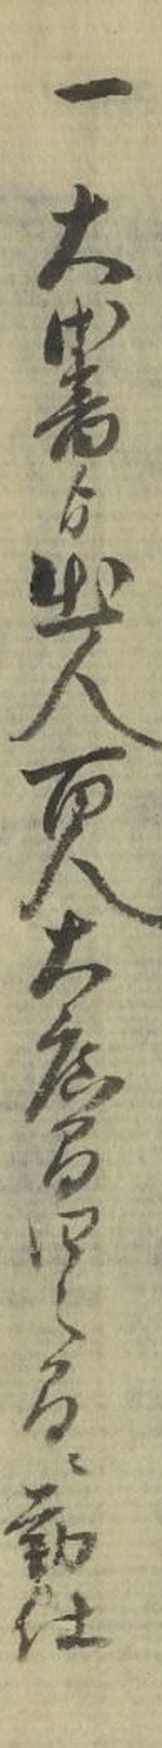一大御番ゟ出人百人大広間四之間に勤仕
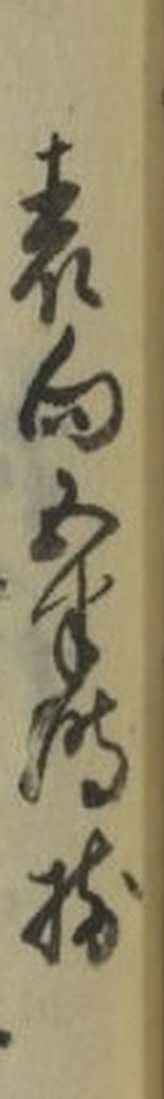表向五半時揃
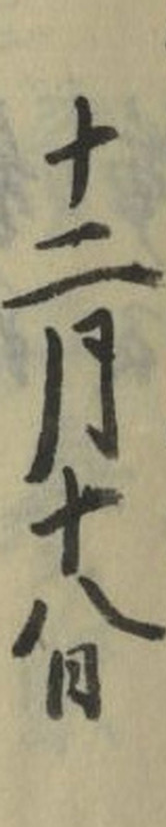十二月十八日
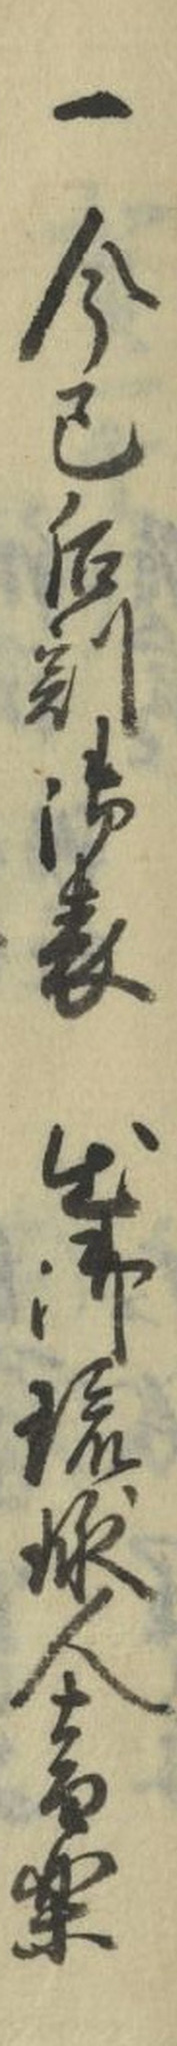一今已后割御表出御琉球人音楽
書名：戊辰琉球人来朝之式 全
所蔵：University of the Ryukyus Library
